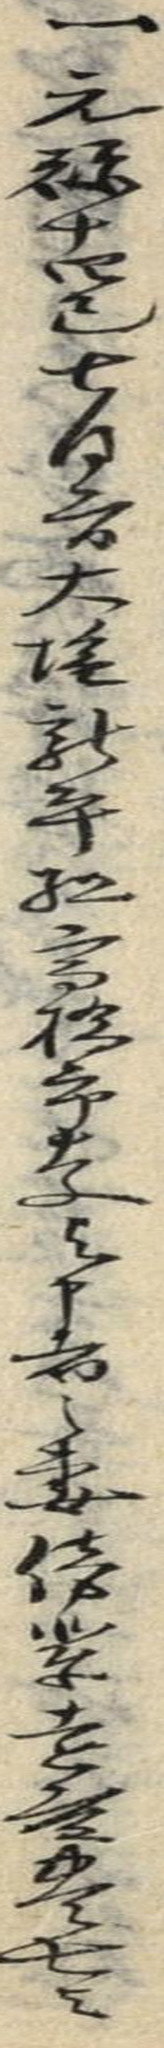一元禄十四巳七月二日大塩新平組高橋市大夫と申者之妻傍輩遠藤豊七と
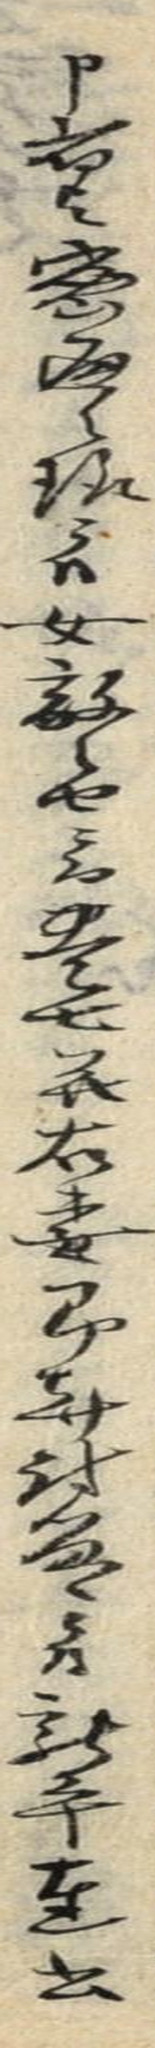申者と密通之趣に付女敵之由にて豊七并右妻即刻討留候に付新平達書
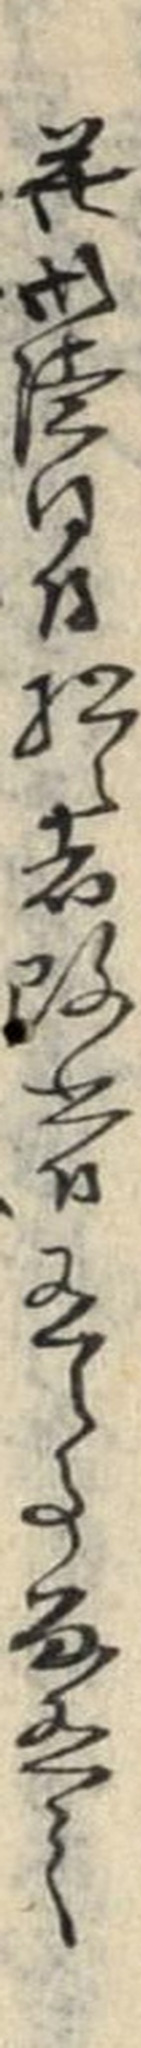并御徒目付組之者改書付有之事留有之
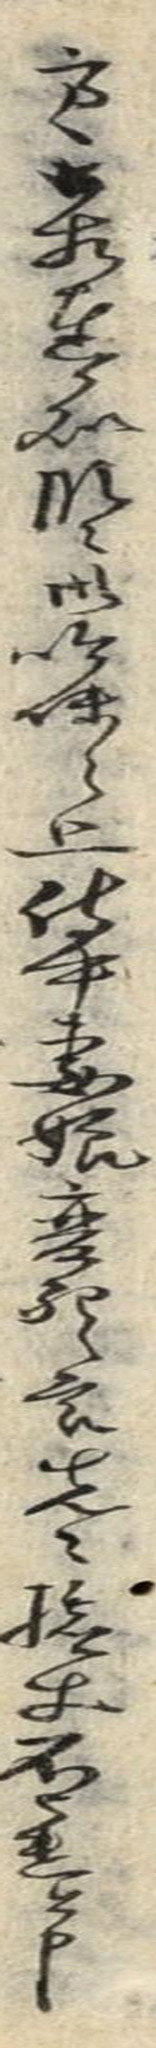方へ相達候処段々御吟味之上侍中妻娘変死之節先々検使不被遣と申
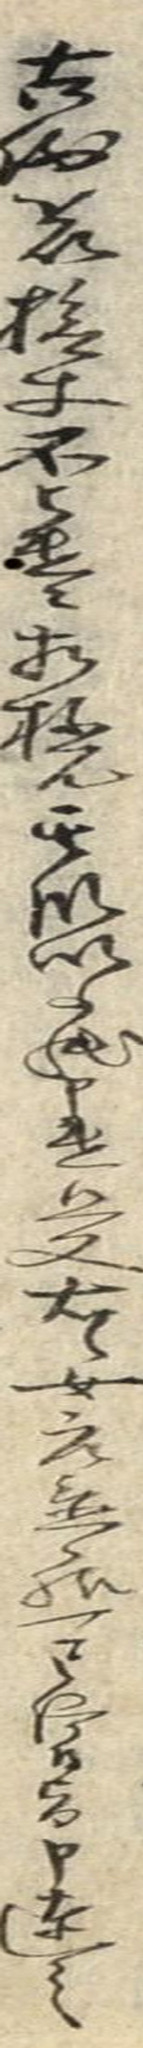古例を以検使不被遣と相極ル其段以手紙申遣且又右之女取置候様可被仰付旨申達之
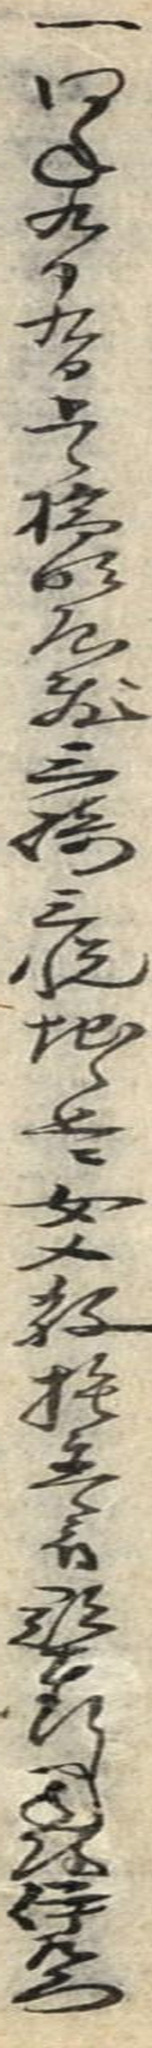一同年九月九日上之橋明屋敷三崎三悦地之上に女〆殺捨置候に付郡奉行周防伊左衛門
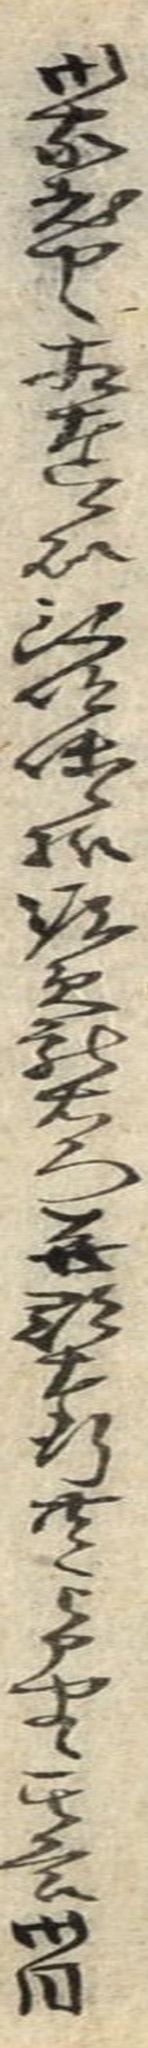御家老中へ相達候処致吟味候様渥美新右衛門并郡奉行共へ被申聞候其節御目
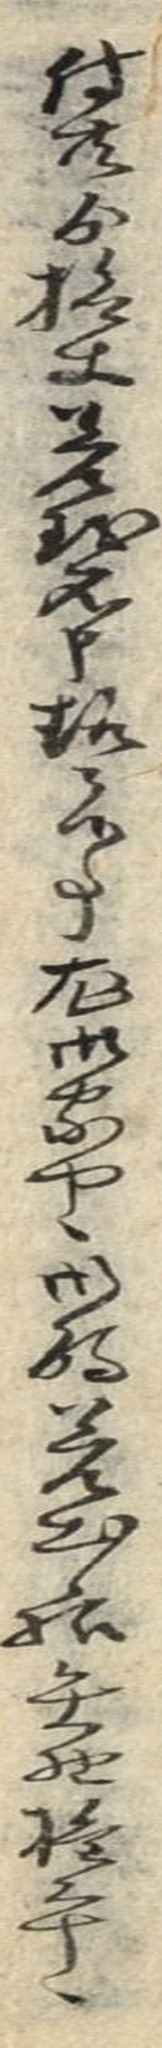付共ゟ検使差越不申趣に候事尤御家中へ御触差出候様矢野権平へ
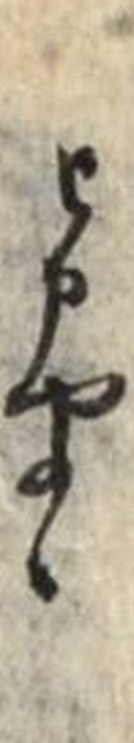被申聞候
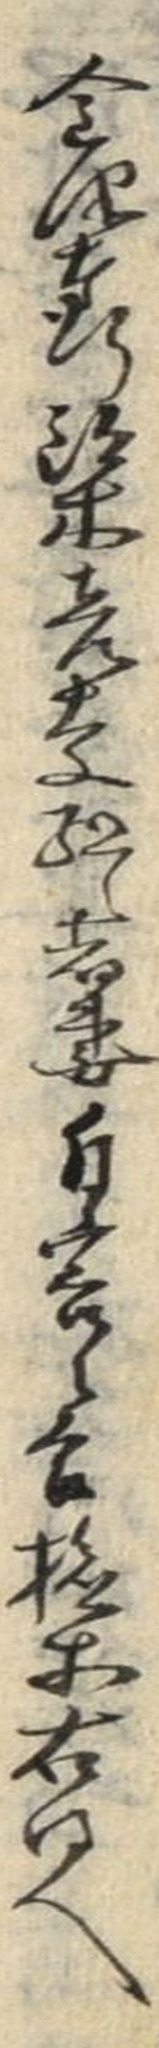一金津奉行鈴木彦大夫組之者妻自害之節検使右同人

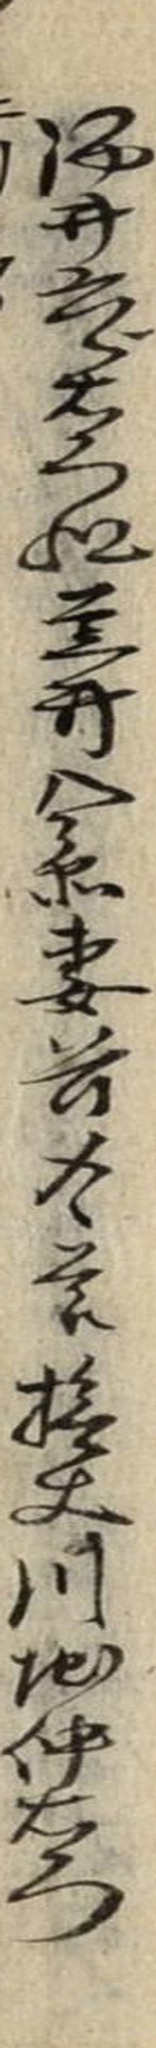一酒井六郎右衛門組荒井八兵衛妻首〆候節検使川地仲右衛門
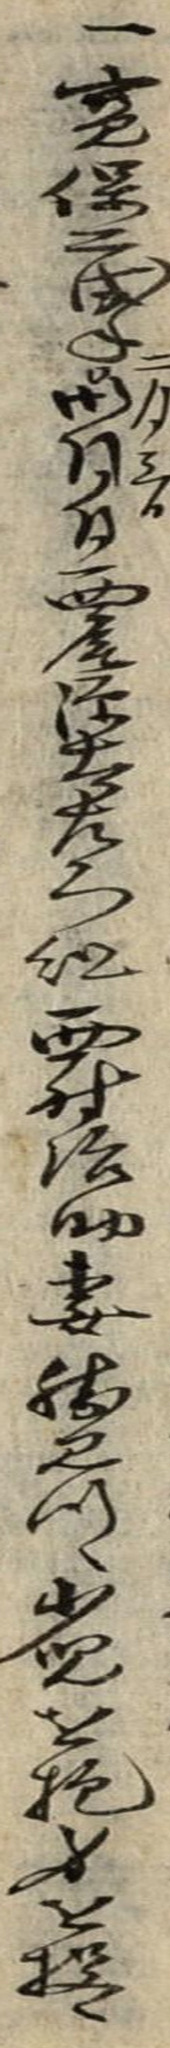一寛保二戌年◦御目付西尾源太左衛門組西村治助妻勝見川へ小児を抱身を投候
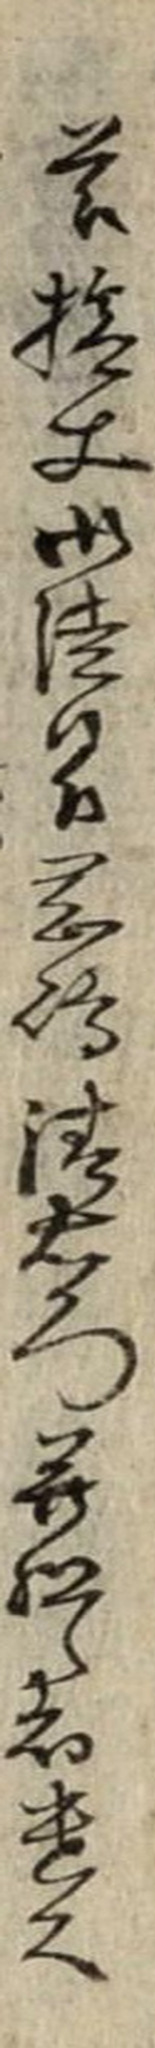節検使御徒目付岡島清右衛門并組之者遣ス
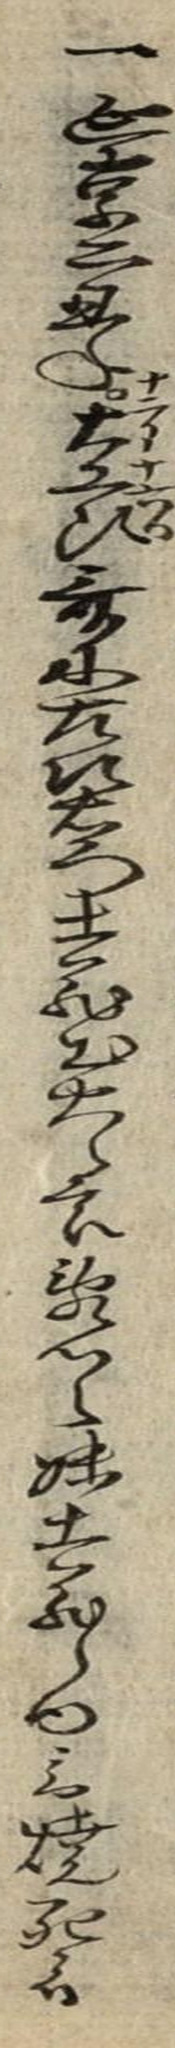一延享二丑年◦大工頭斎木左次右衛門土蔵出火之節乱心之妹土蔵之内にて焼死に付
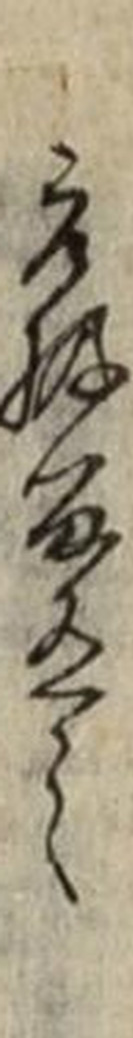取扱留有之
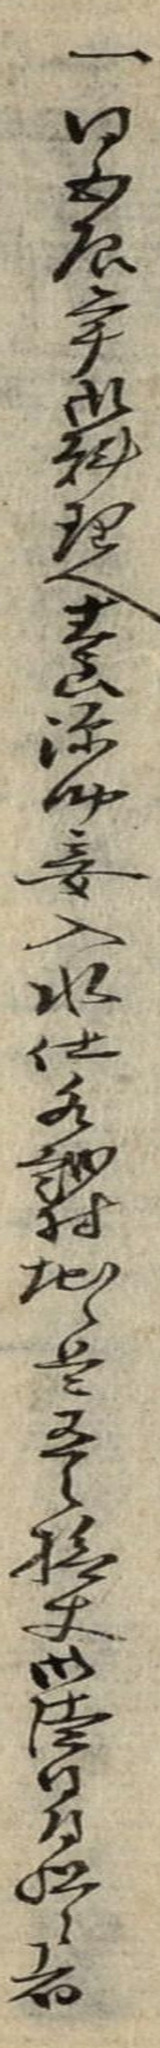一同五辰年御料理人青山源助妾入水仕水越村地之上に有之検使御徒目付組之者
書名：御停止異変死失
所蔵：福井県文書館 Fukui Prefectural Archives
